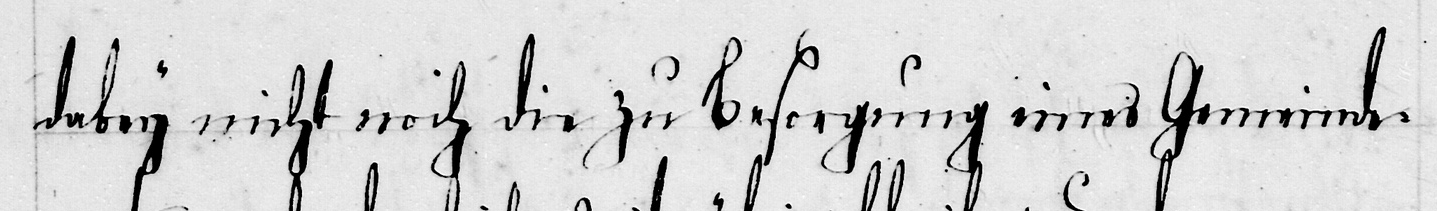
dabey nicht noch die zu Besorgung eines Gemeinde¬
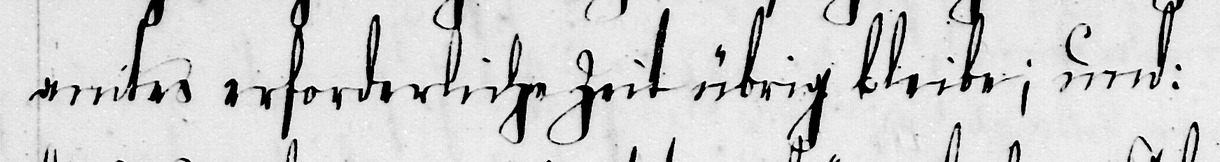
amtes erforderliche Zeit übrig bleibe; und:
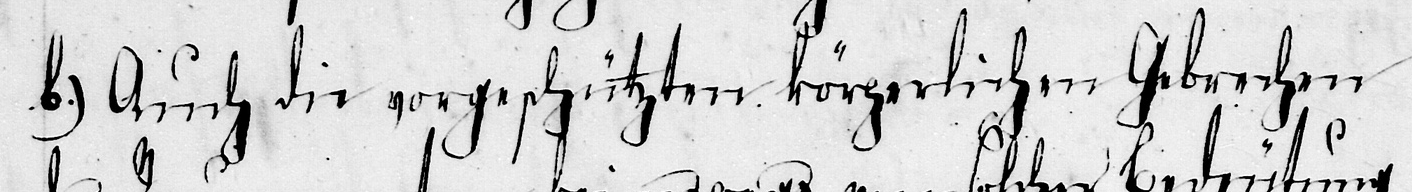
b.) Auch die vorgeschützten körperlichen Gebrechen
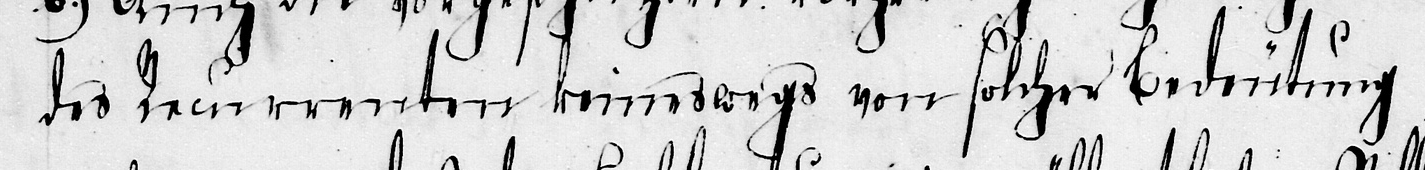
des Recurrenten keineswegs von solcher Bedeutung
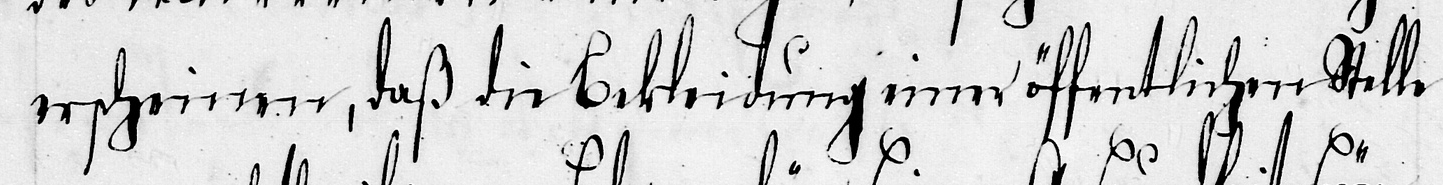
erscheinen, daß die Bekleidung einer öffentlichen Stelle
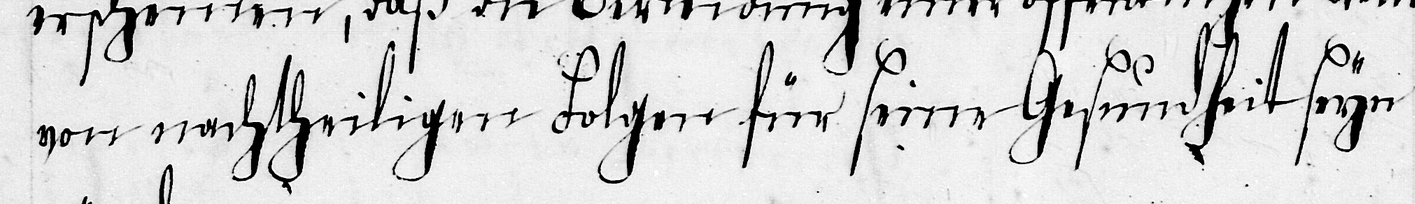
von nachtheiligen Folgen für seine Gesundheit seyn
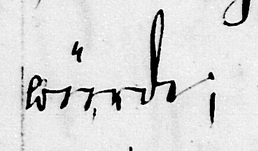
würde;
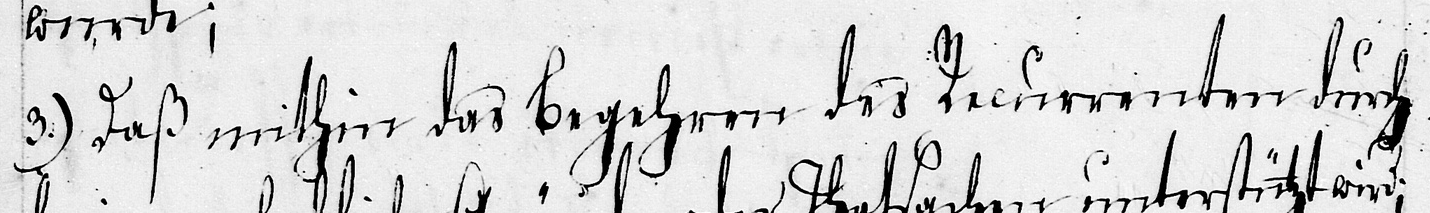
3.) Daß mithin das Begehren des Recurrenten durch
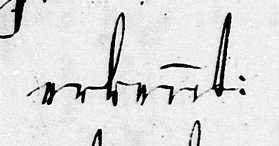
erkennt:
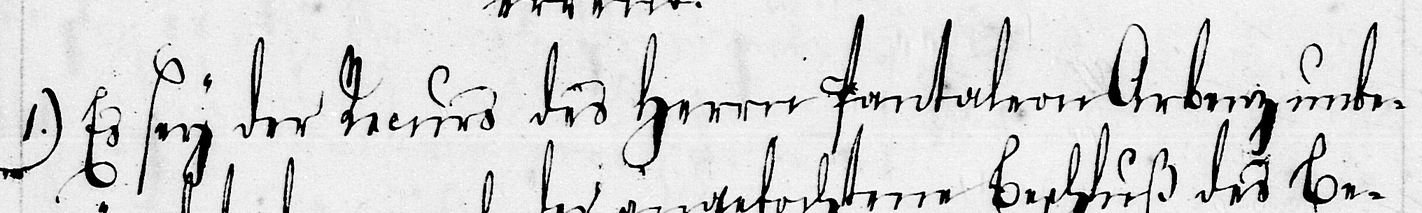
Es sey der Recurs des Herrn Pantaleon Arbenz unbe¬
